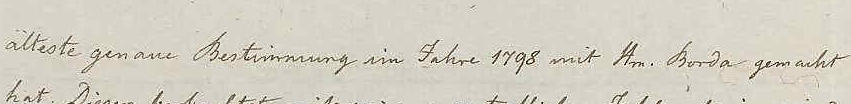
älteste genaue Bestimmung im Jahre 1798 mit Hrn. Borda gemacht
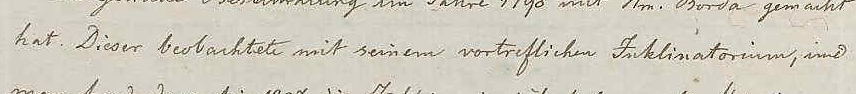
hat. Dieser beobachtete mit seinem vortreflichen Inklinatorium, und
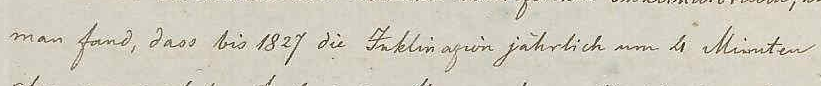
man fand, dass bis 1827 die Inklinazion jährlich um 4 Minuten
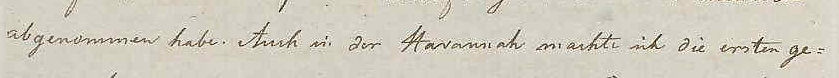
abgenommen habe. Auch in der Havannah machte ich die ersten ge-
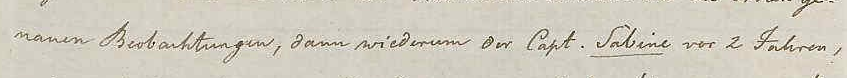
nauen Beobachtungen, dann wiederum der Capt. Sabine vor 2 Jahren,
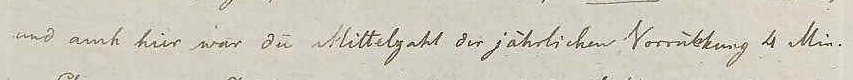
und auch hier war die Mittelzahl der jährlichen Vorrükkung 4 Min.
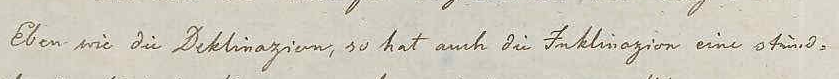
Eben wie die Deklinazion, so hat auch die Inklinazion eine stünd-
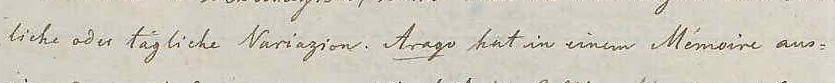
liche oder tägliche Variazion. Arago hat in einem Mémoire aus-
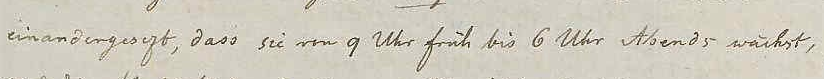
einandergesezt, dass sie von 9 Uhr früh bis 6 Uhr Abends wächst,
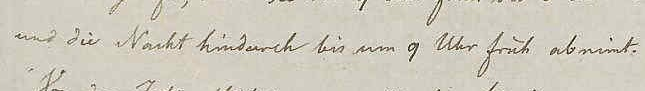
und die Nacht hindurch bis um 9 Uhr früh abnimt.
